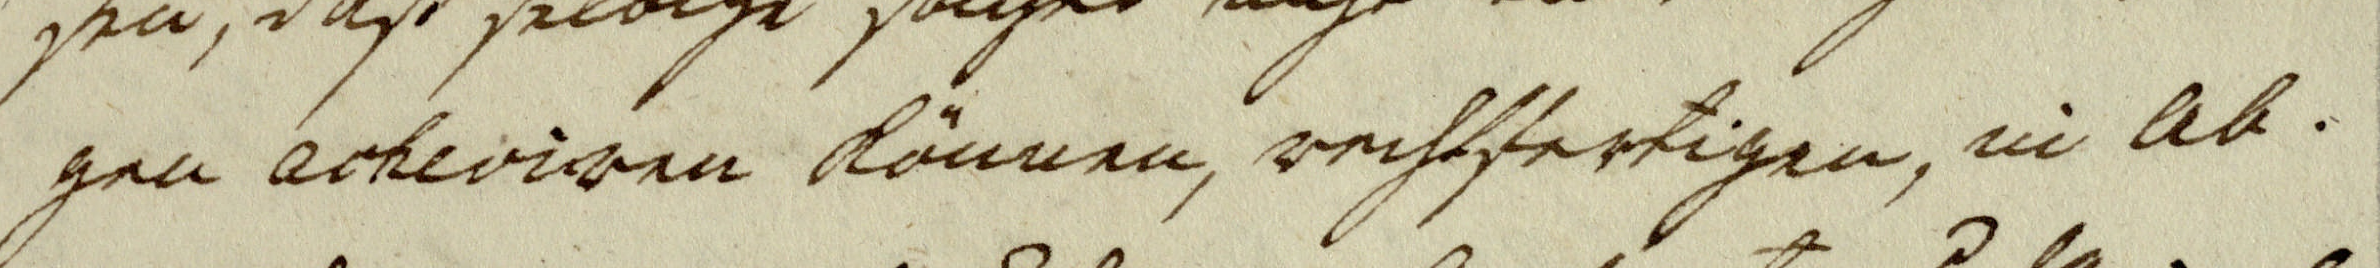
gen acheriren können, rechtfertigen, in Ab¬
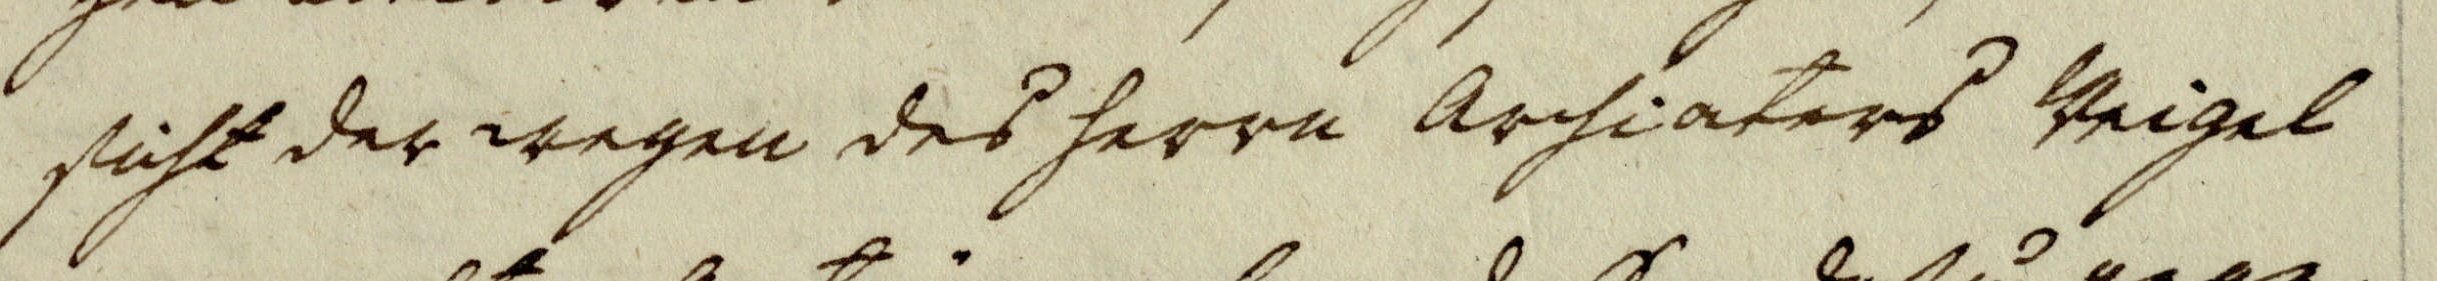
sicht der wegen des Herrn Archiaters Weigel
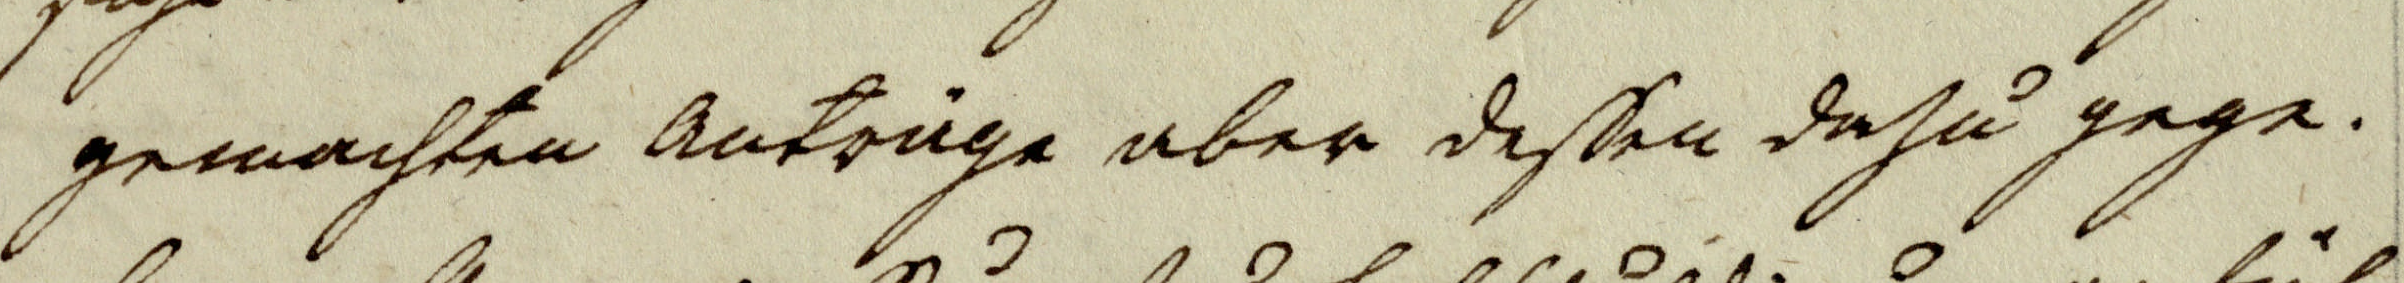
gemachten Anträge aber dessen dazu gege¬
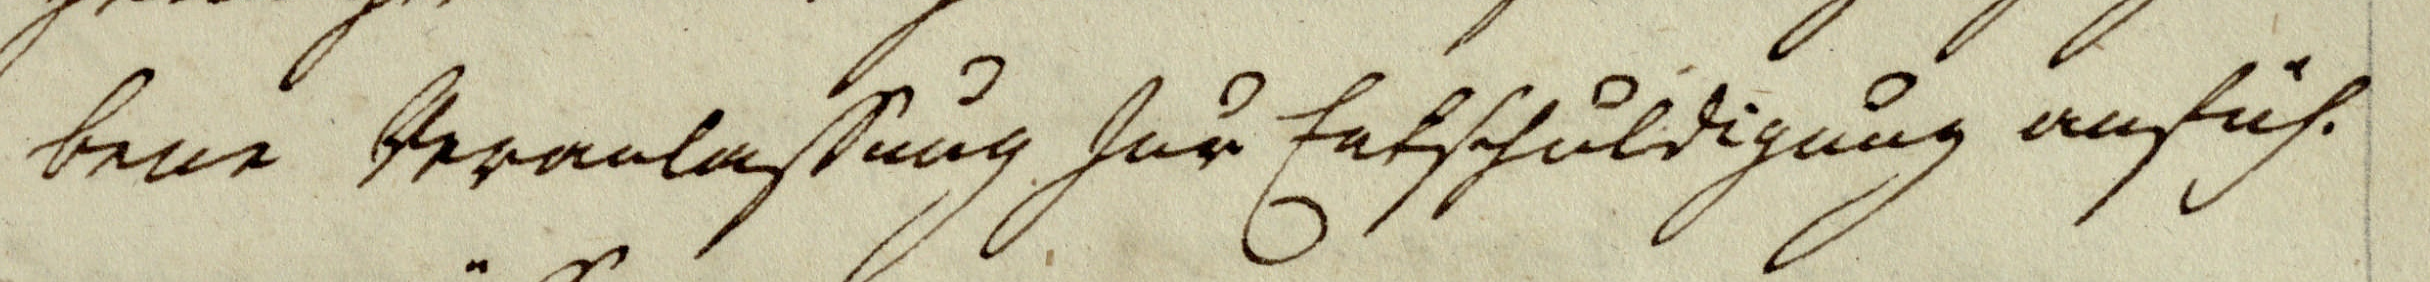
bene Veranlassung zur Entschuldigung anfüh¬
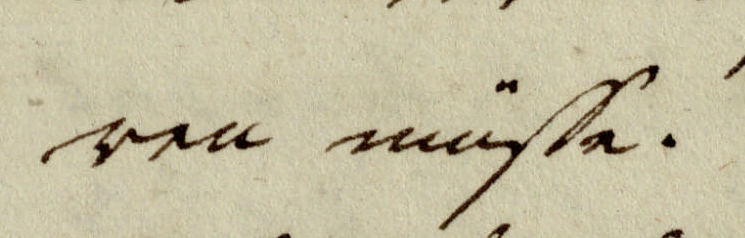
ren müsse.
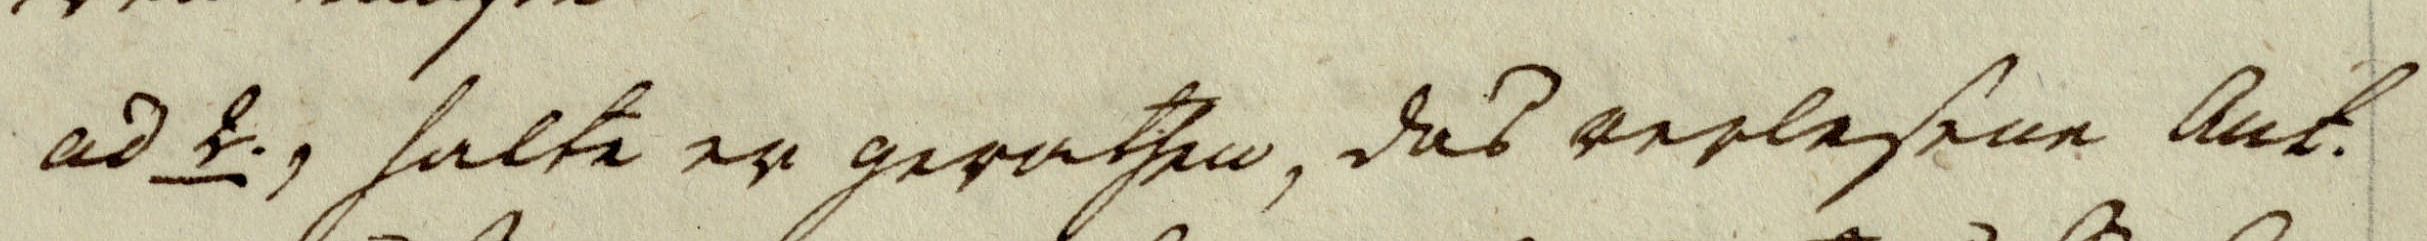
ad 2., halte er gerathen, das verlesene Ant¬
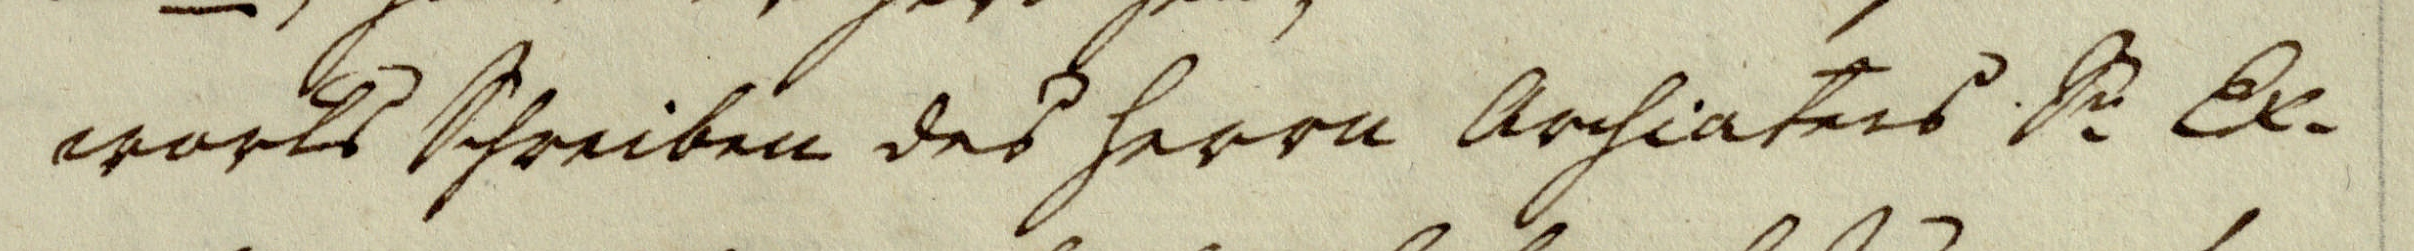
worts Schreiben des Herrn Archiaters Sr Ex¬
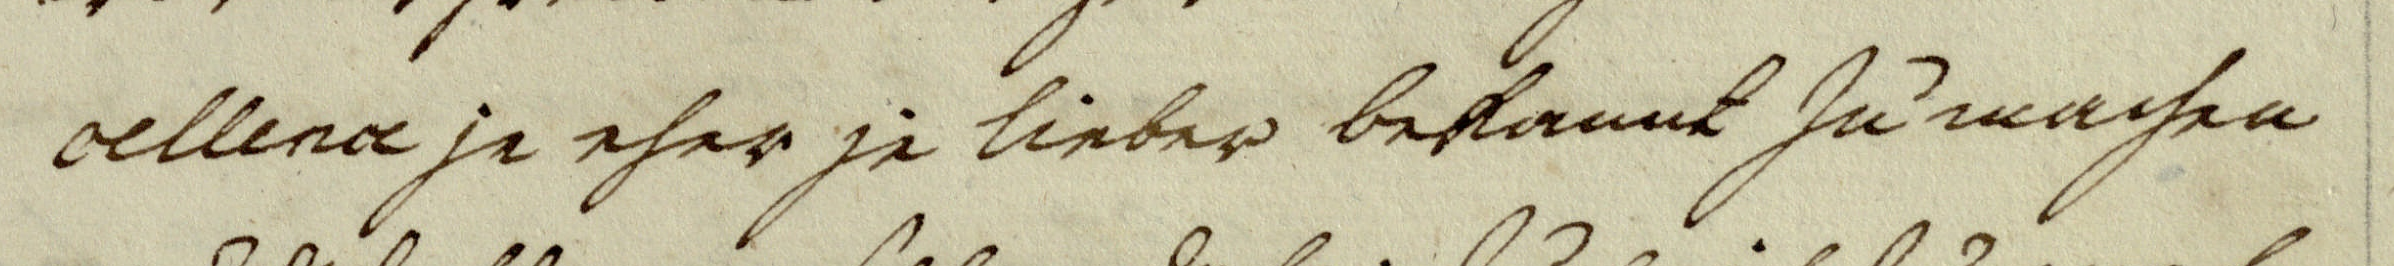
cellence je eher je lieber bekannt zu machen
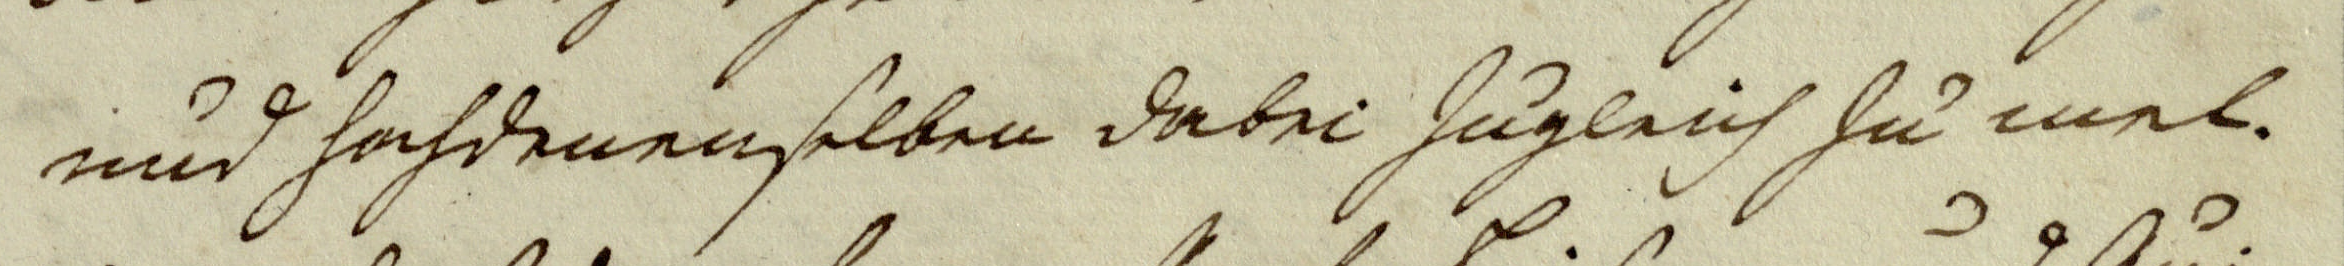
und hochdenenselben dabei zugleich zu mel¬
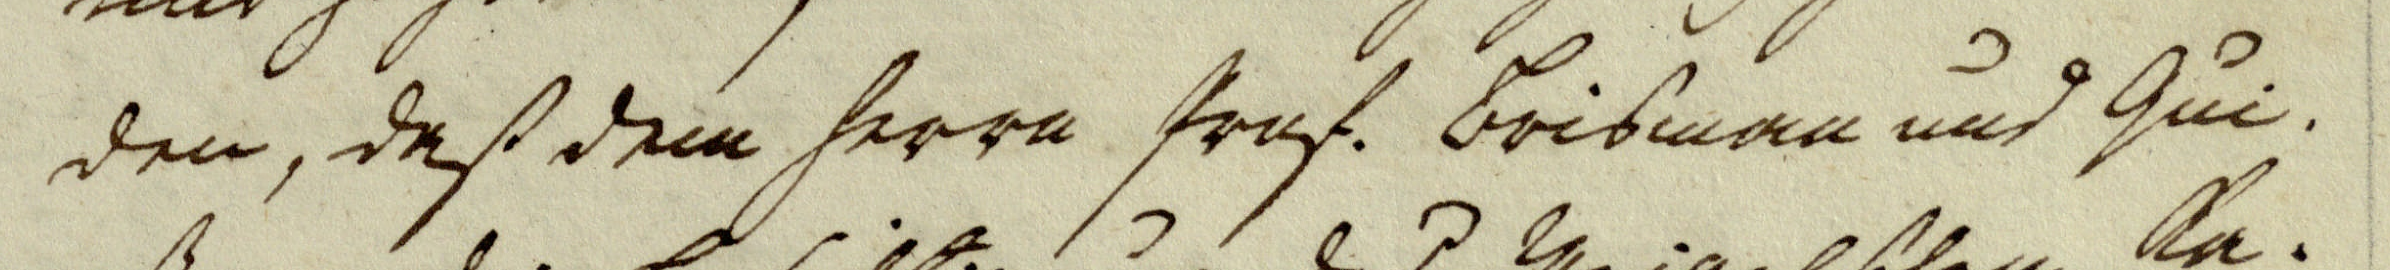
den, daß dem Herrn Prof. Brisman und Qui¬
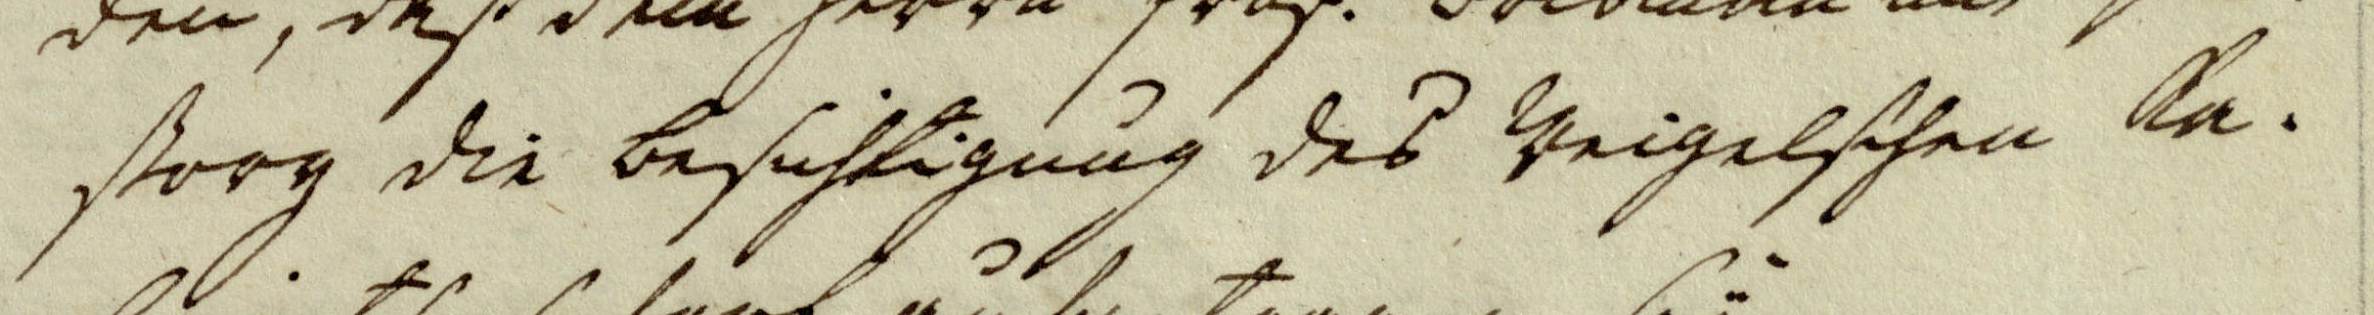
storp, die Besichtigung des Weigelschen Ka¬
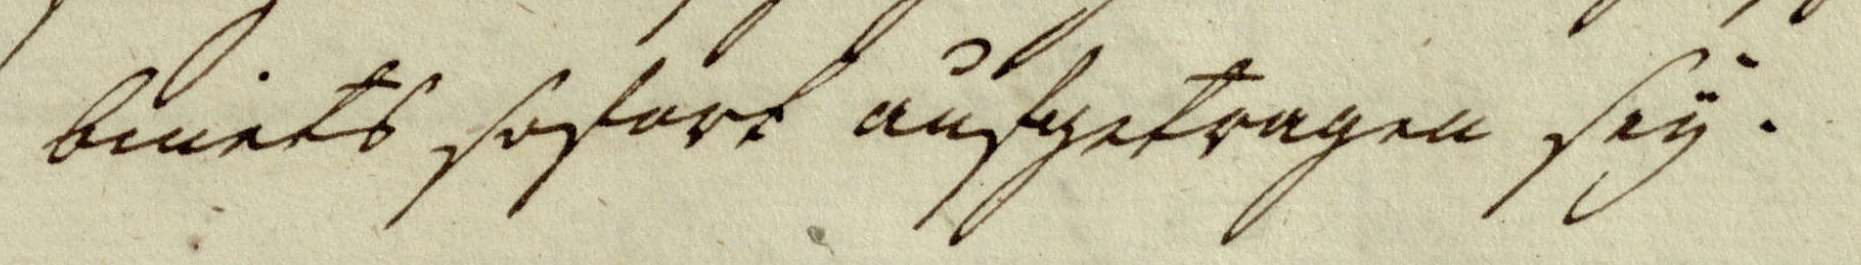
binets sofort aufgetragen seÿ.
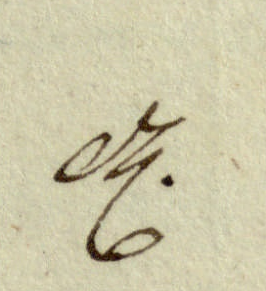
dh.
